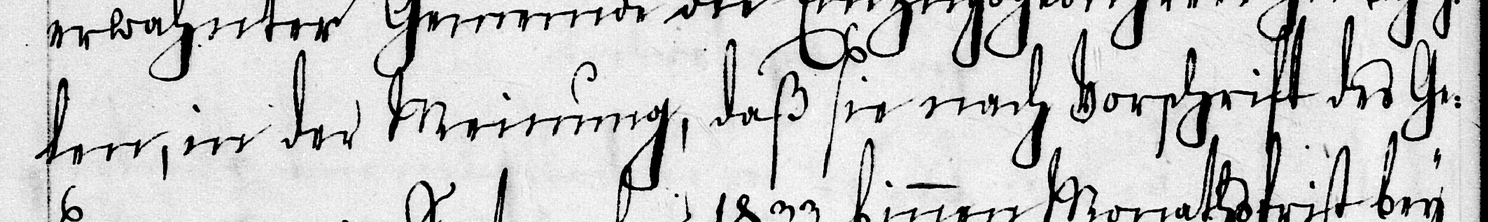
len, in der Meinung, daß sie nach Vorschrift des Ge¬
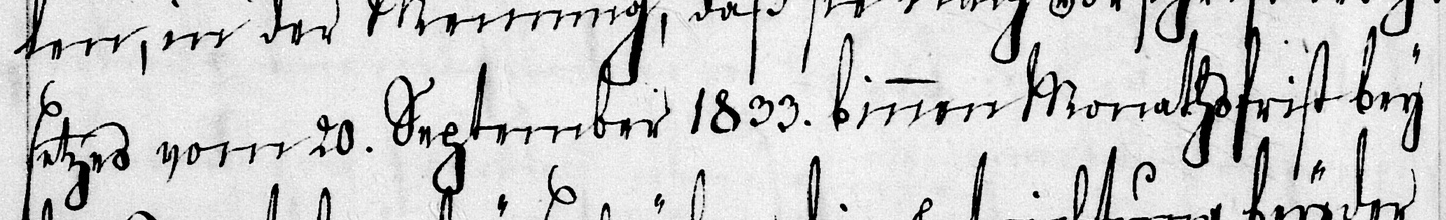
setzes vom 20. September 1833. binnen Monathsfrist bey
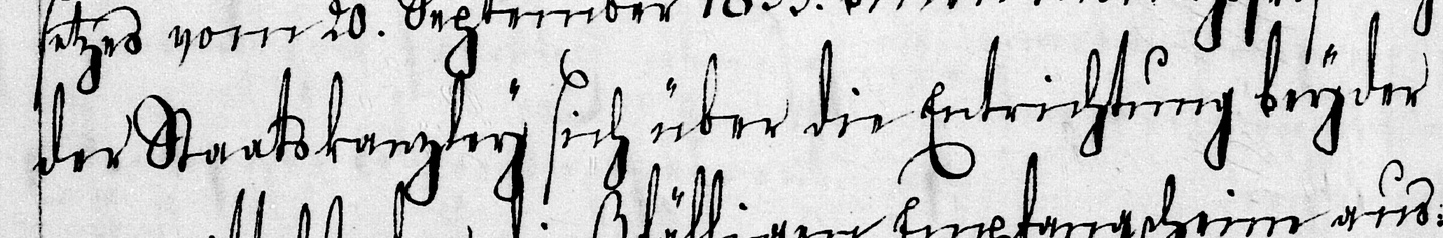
der Staatskanzley sich über die Entrichtung beyder
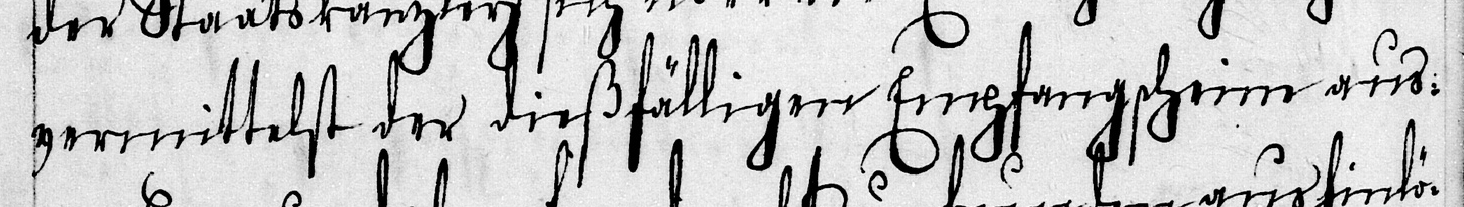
vermittelst der dießfälligen Empfangscheine aus¬
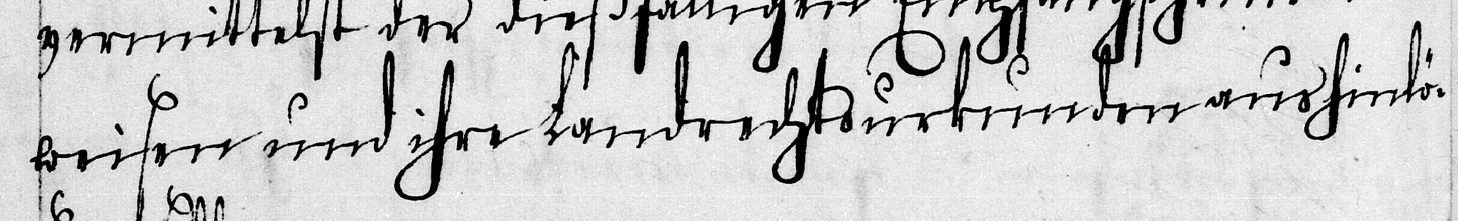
weisen und ihre Landrechtsurkunden aushinlö¬
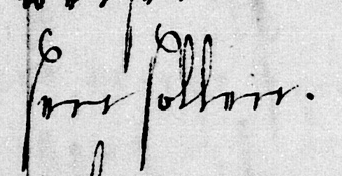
sen sollen.
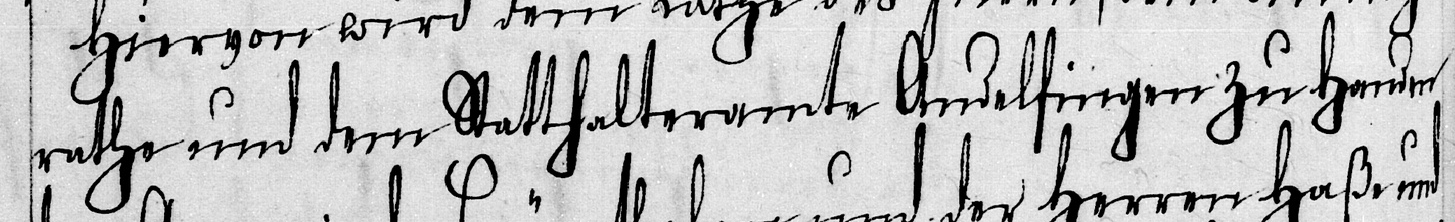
rathe und dem Statthalteramte Andelfingen zu Handen
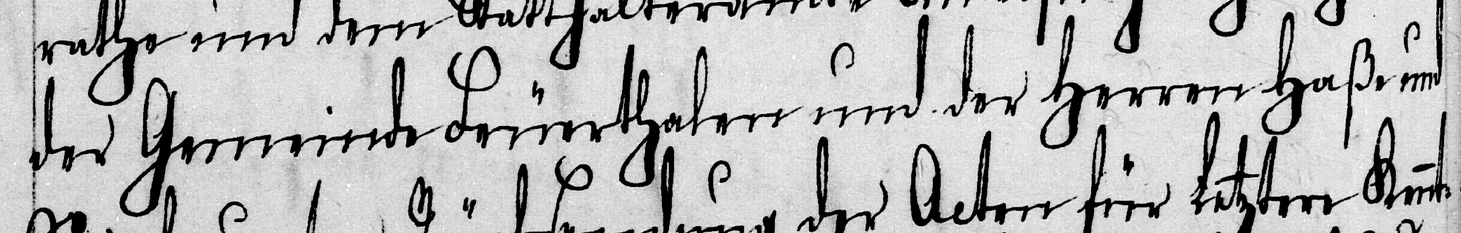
der Gemeinde Feuerthalen und der Herren Haße
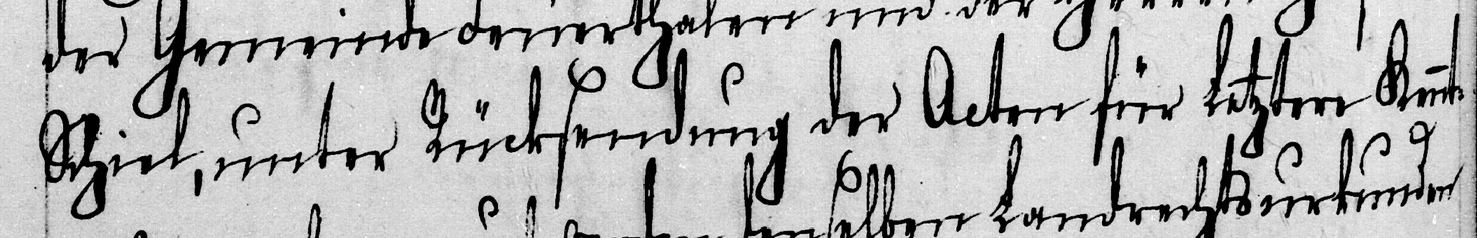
Schiel, unter Rücksendung der Acten für Letztere Ken¬
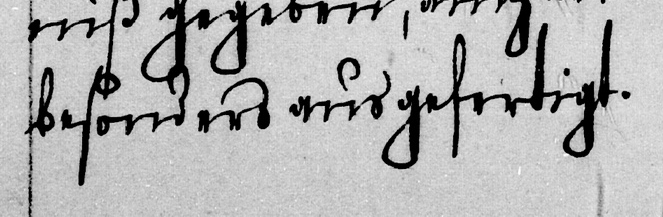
besonders ausgefertigt.
